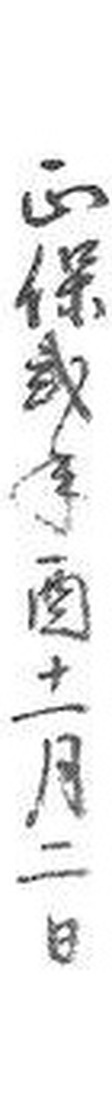正保弐年酉十一月二日
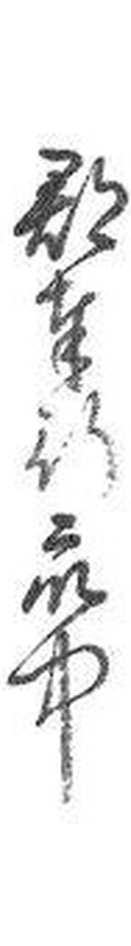郡奉行衆中
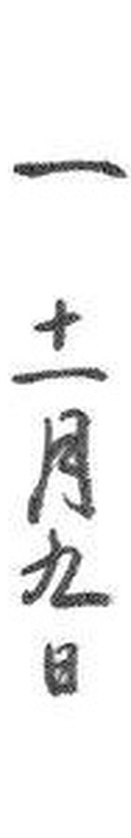一十一月九日
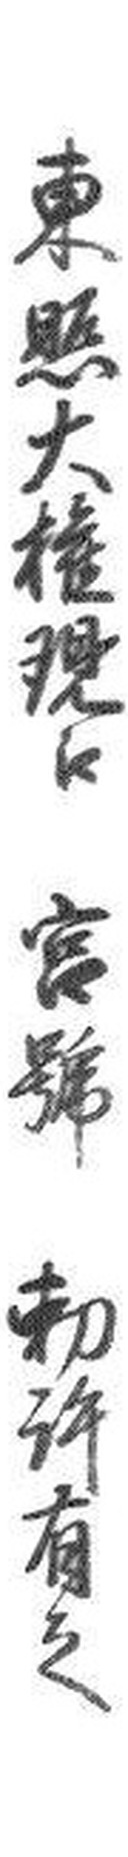東照大権現江宮号勅許有之
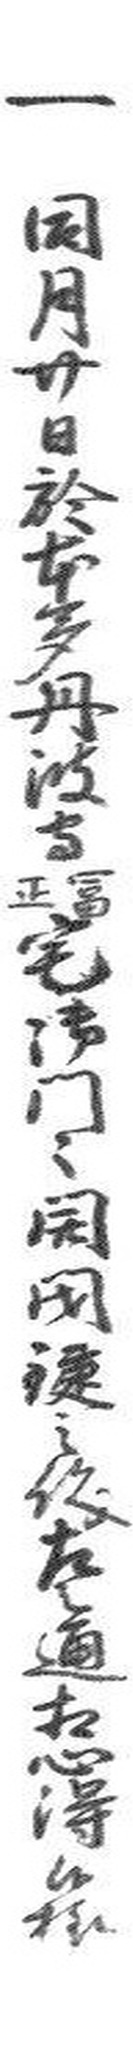一同月廿日於本多丹波守富正宅御門々開閉鍵之儀左之通相心得候様
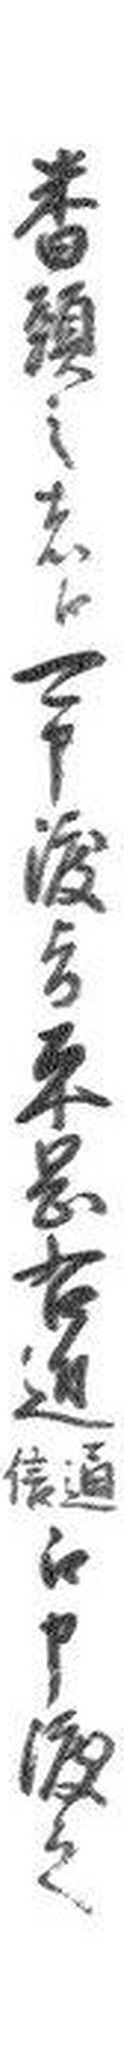番頭之者江可申渡旨平岡右近通信江申渡之
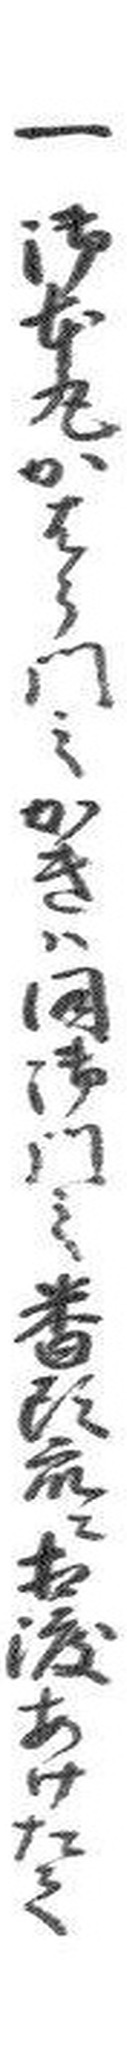一御本丸かはら門之かきハ同御門之番頭衆ニ相渡あけたくて
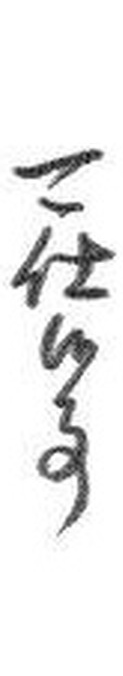可仕候事
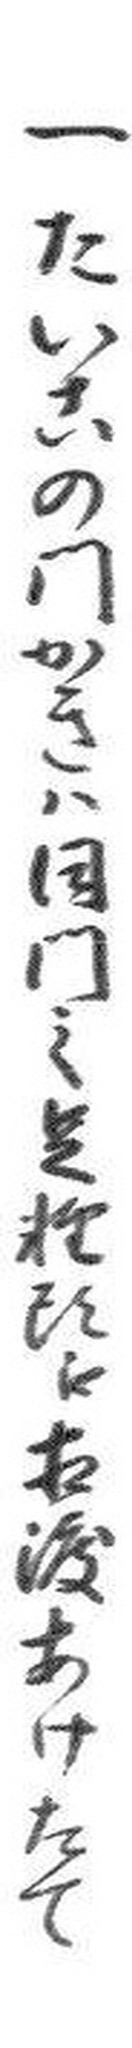一たいこの門かきハ同門之足軽頭江相渡あけたて
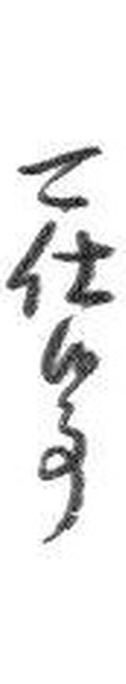可仕候事
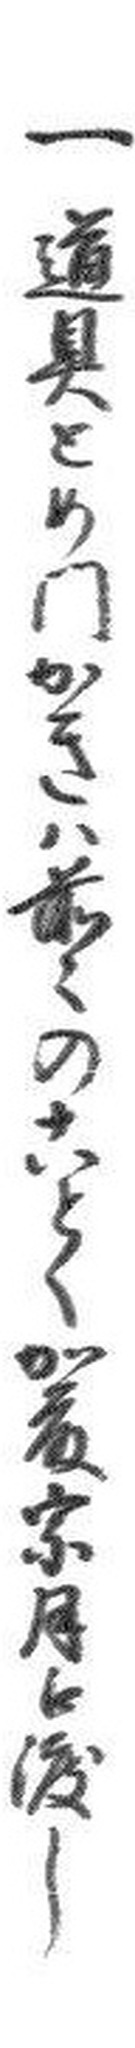一道具とめ門かきハ前々のことく加藤宗月江渡し
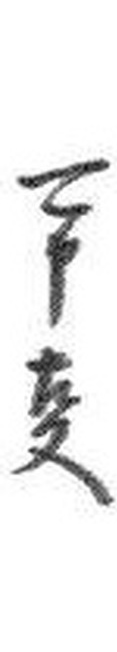可申事
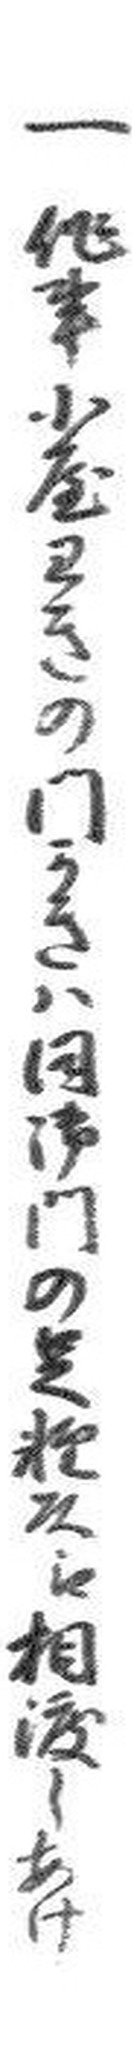一作事小屋わきの門かきハ同御門の足軽頭江相渡しあけ
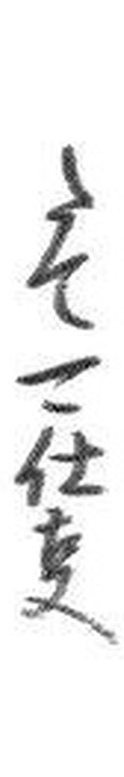たて可仕事
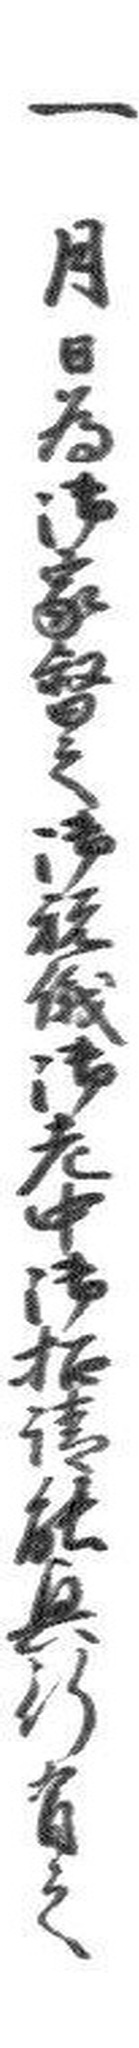一月日為御家督之御祝儀御老中御招請能興行有之

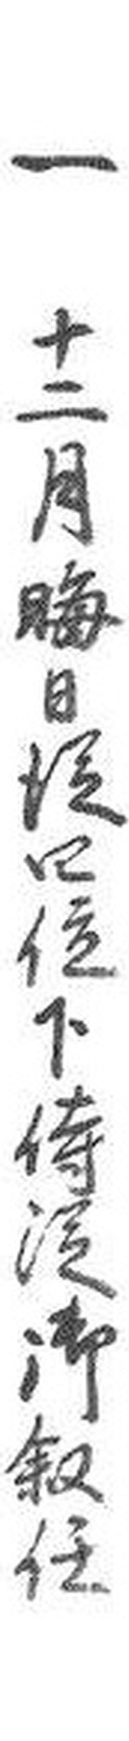一十二月晦日従四位下侍従叙任
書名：家譜 五 光通公 従寛永十三年到万治二年
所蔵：福井県文書館 Fukui Prefectural Archives
